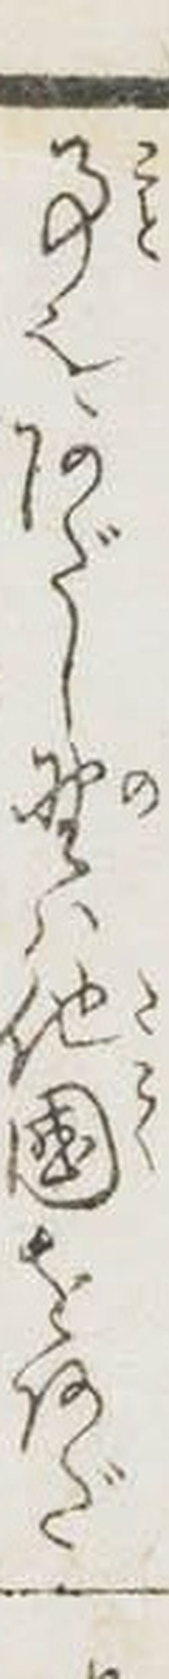事也あだし野は他国をあだ
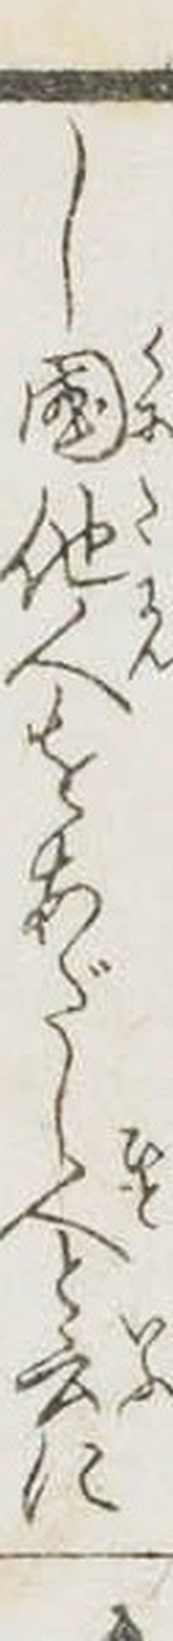し国他人をあだし人と云に
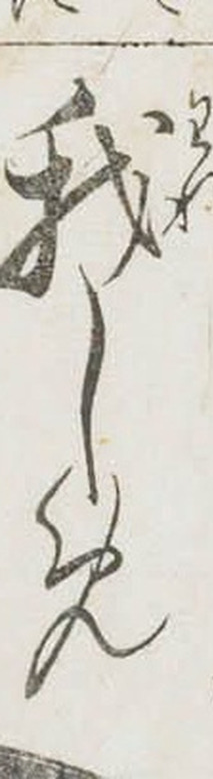我しめ
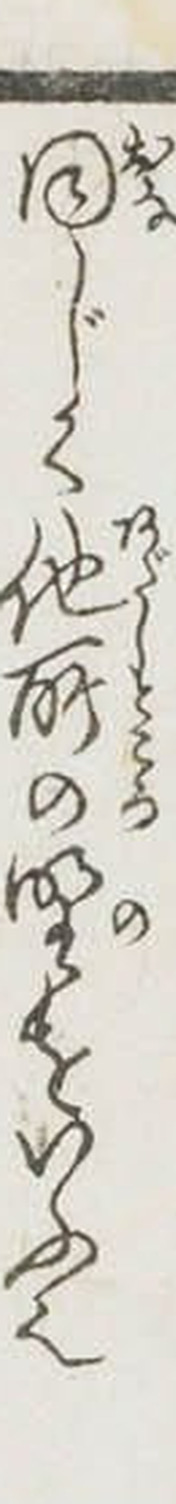同じく他所の野をいふ也
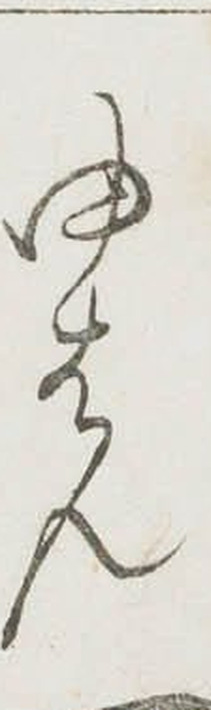ゆはん
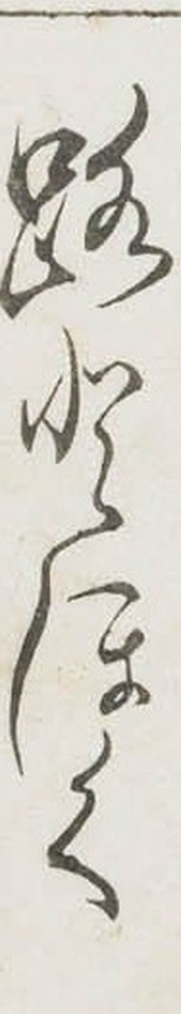路とほく
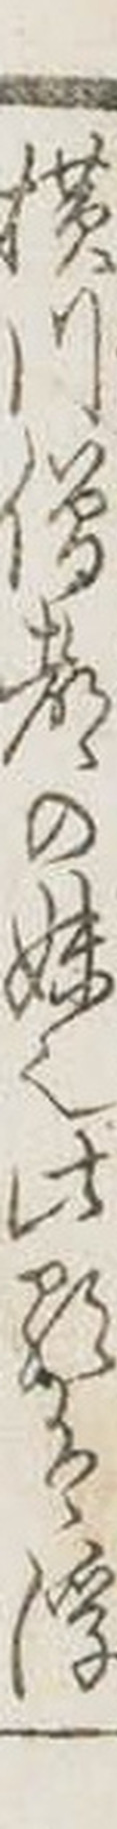横川僧都の妹也此歌は浮
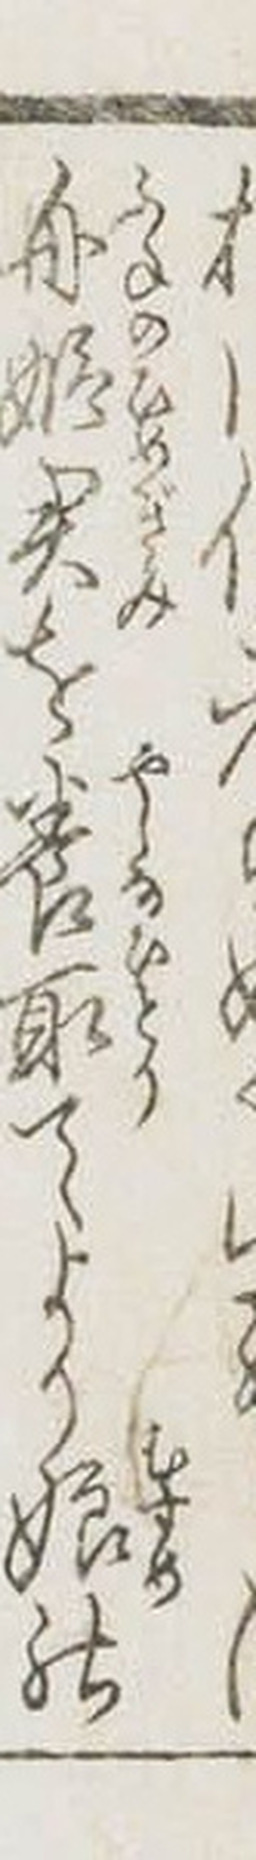舟姫君を養取てより娘の
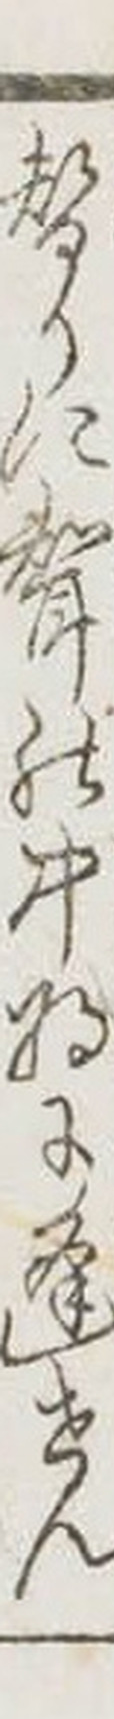替りに聟の中将に逢せん
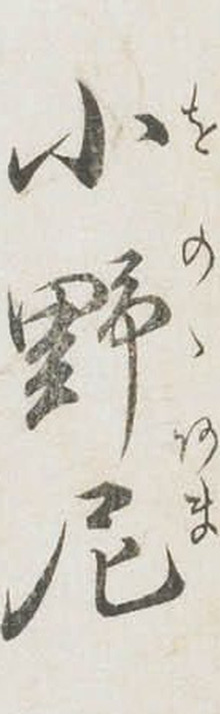小野尼
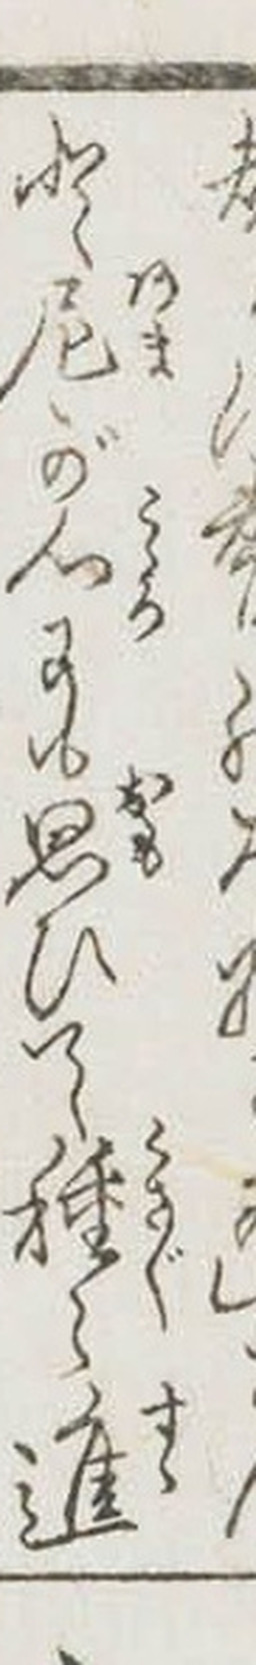と尼が心にも思ひて種々進
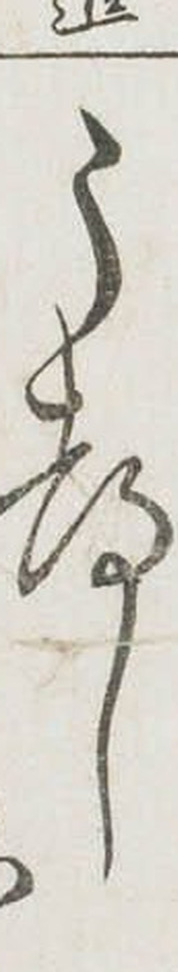うつし
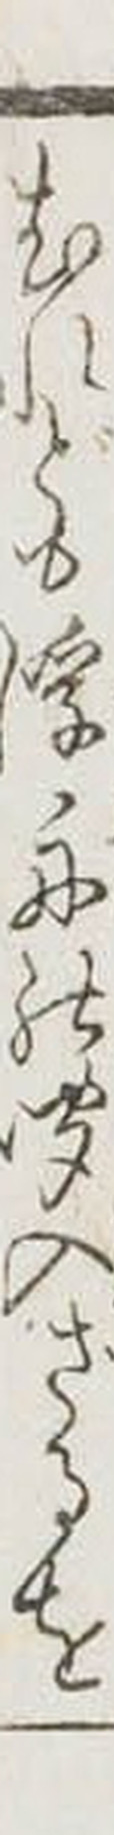むれども浮舟の聞入ざるを
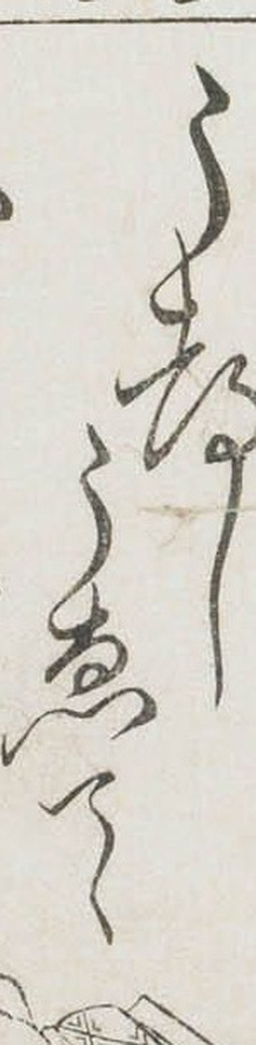うゑて
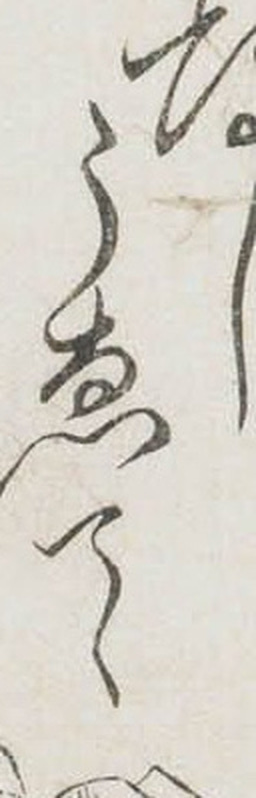うゑて
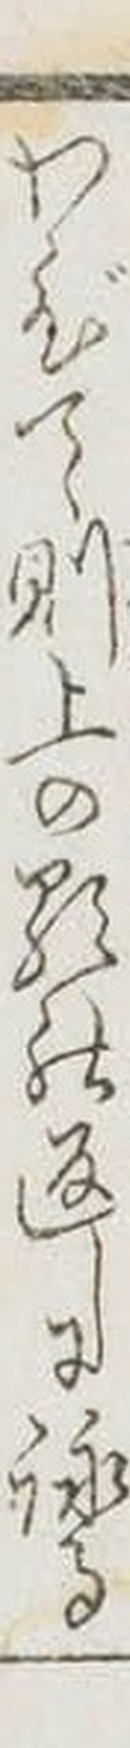わびて則上の歌の返しに詠る
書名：源氏百人一首
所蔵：東京学芸大学教育コンテンツアーカイブ
